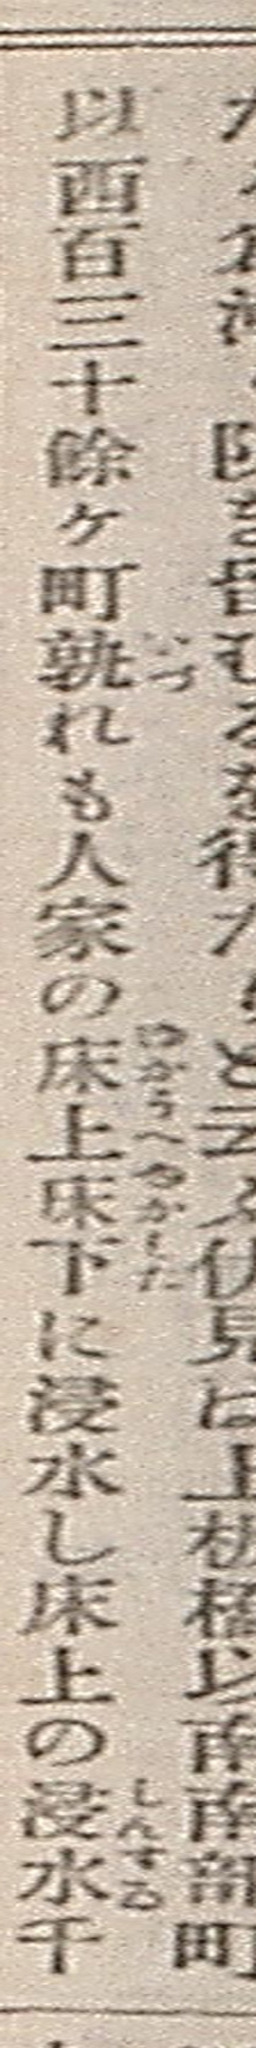以西百三十餘ヶ町孰れも人家の床上床下に浸水し床上の浸水千
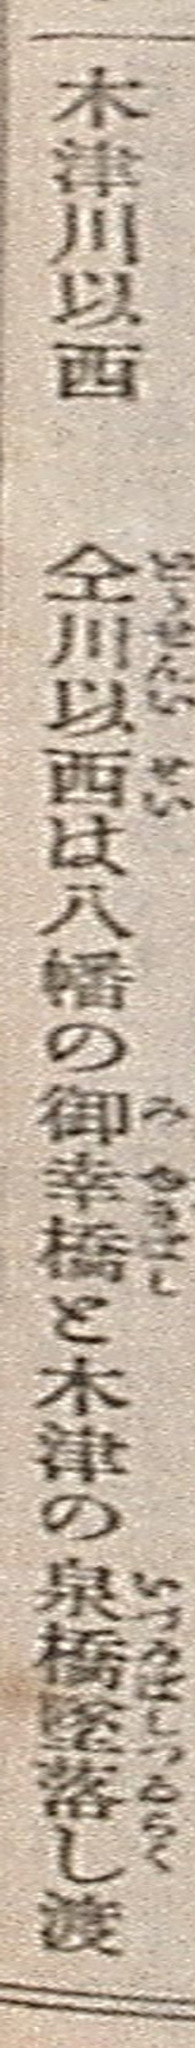木津川以西同川井西は八幡の御幸橋と木津の泉橋墜落し渡

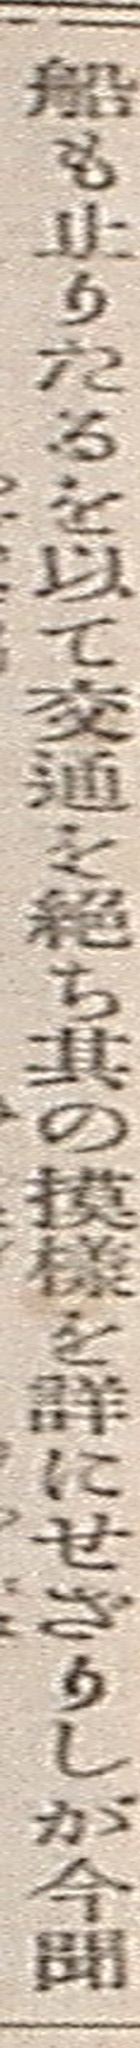船も止たりるを以て交通を絶ち其の模様を詳にせざりしが今聞
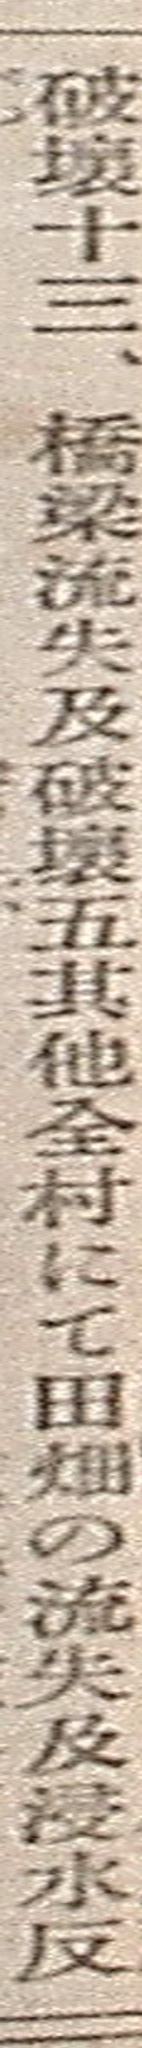破壊十三、橋梁流失及破壊五其他全村にて田畑の流失及浸水反
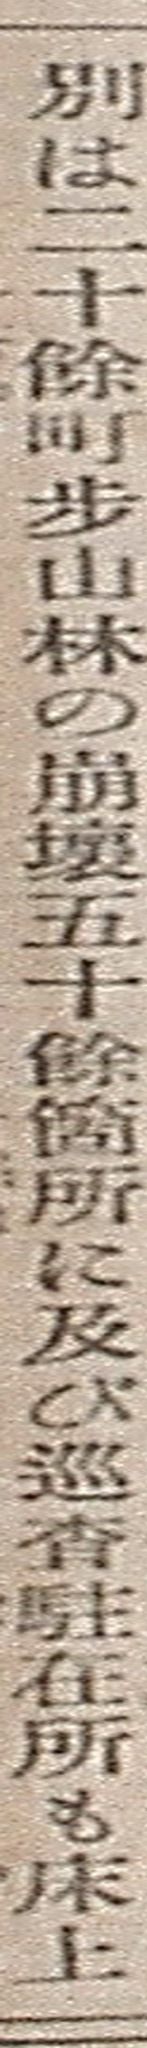別は二十餘町歩山林の崩壊五十餘箇所に及び巡査駐在所も床上
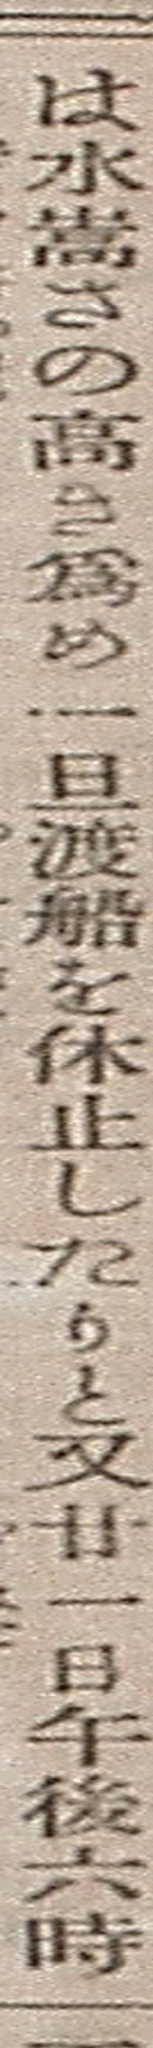は水嵩さの高き為め一旦船渡を休止したりと又廿一日午後六時
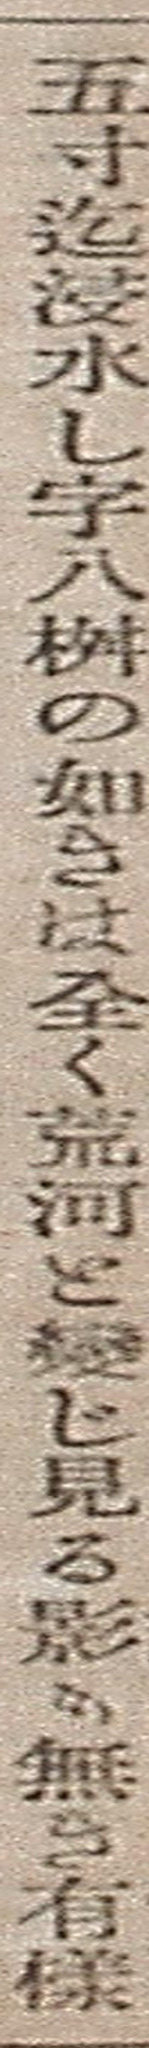五寸迄浸水し字桝の如きは全く荒川と変じ見る影も無き有様
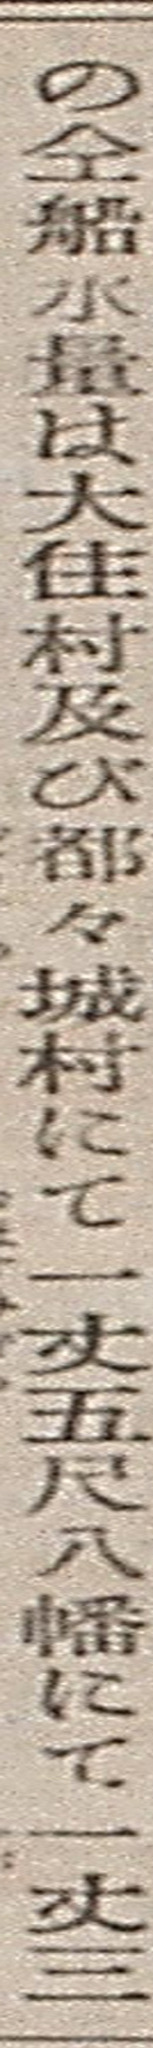の同船水量は大住村及び都々城村にて一丈五尺八幡にて一丈三
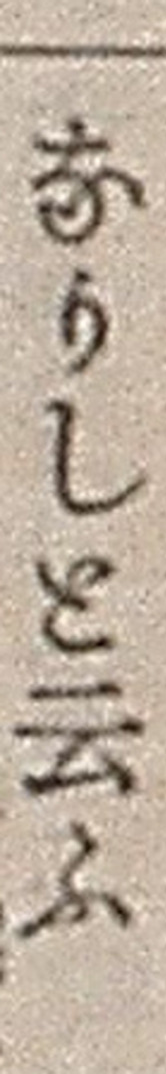なりしと云ふ
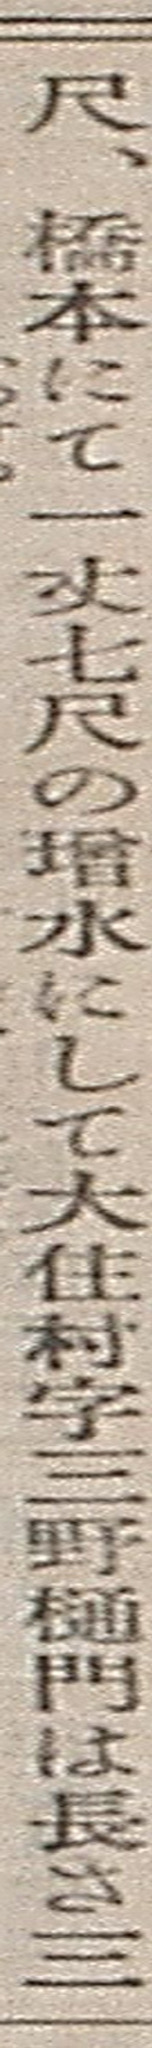尺、橋本にて一丈七尺の増水にして大住村字三野樋門は長さ三
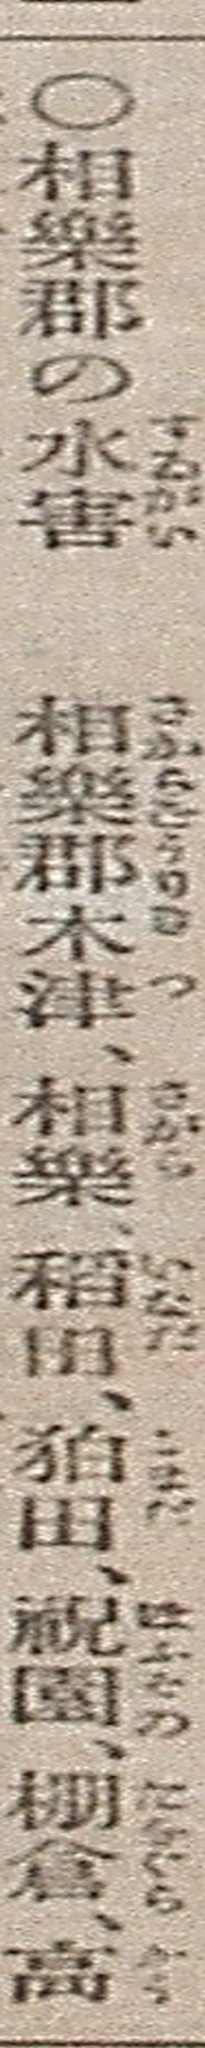◯相楽郡の水害相楽郡木津、相楽、稲田、狛田、祝園、棚倉、高
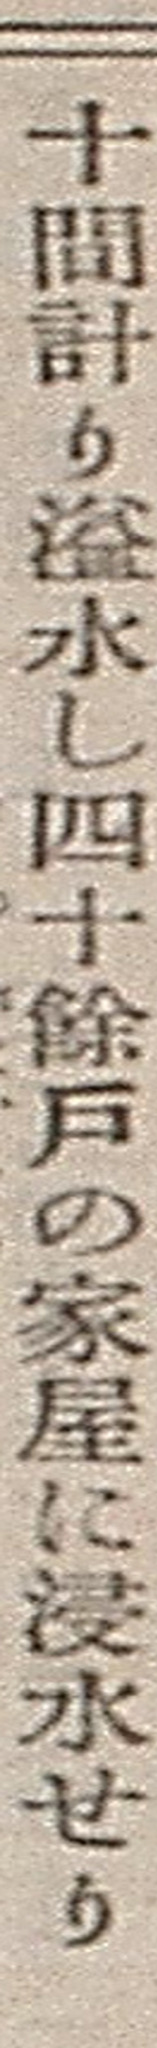十間計り溢水し四十餘戸の家屋に浸水せり
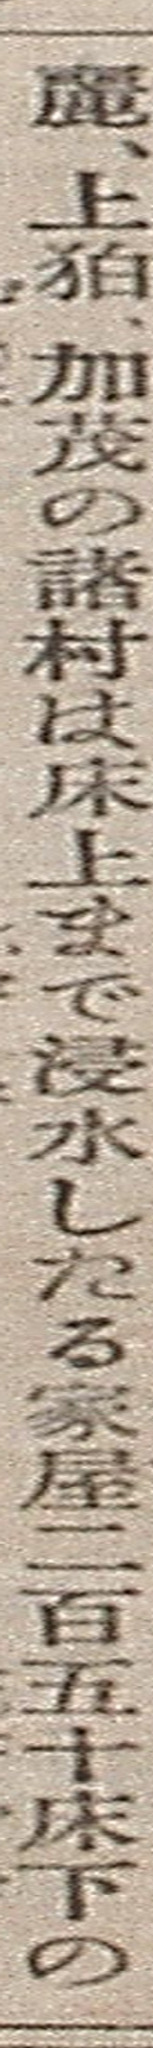麗、上狛、加茂の諸村は床上まで浸水したる家屋二百五十床下の
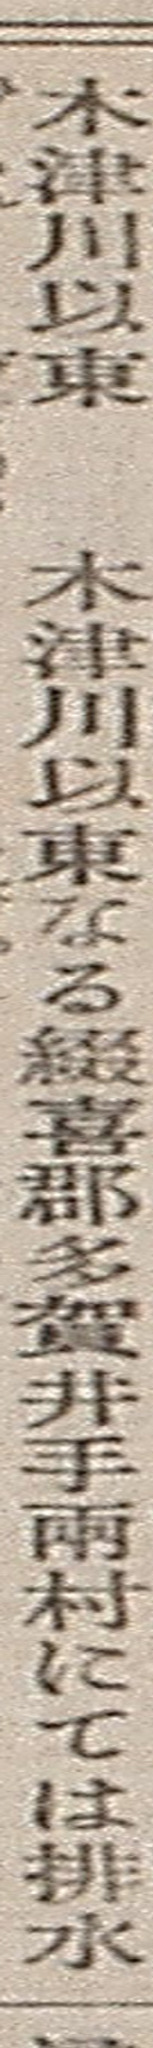木津川以東木津川以東なる綴喜郡多賀井手両村にては排水
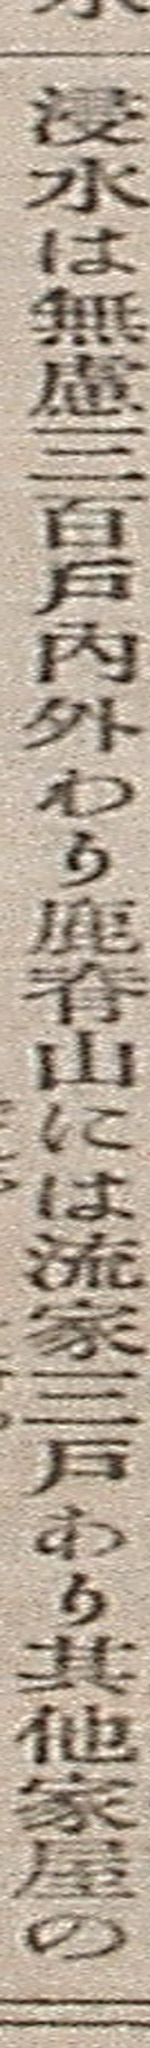浸水は無慮三百戸内外わり鹿脊山には流家三戸あり其他家屋の
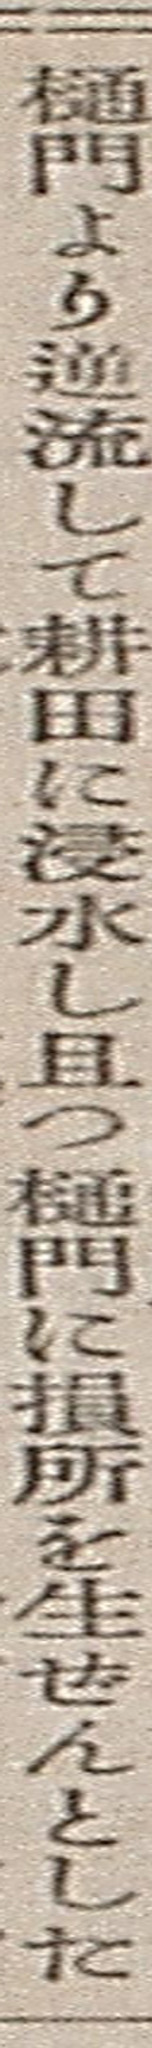樋門より逆流して耕田に浸水し且つ樋門に損所を生ぜんとした
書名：風俗畫報臨時増刊第百二十八號　洪水被害録（下）
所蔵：東京大学地震研究所図書室 Earthquake Research Institute Library, The University of Tokyo, JAPAN
